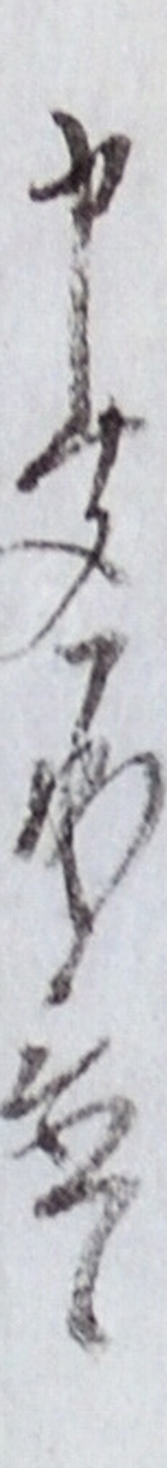申聞承置候
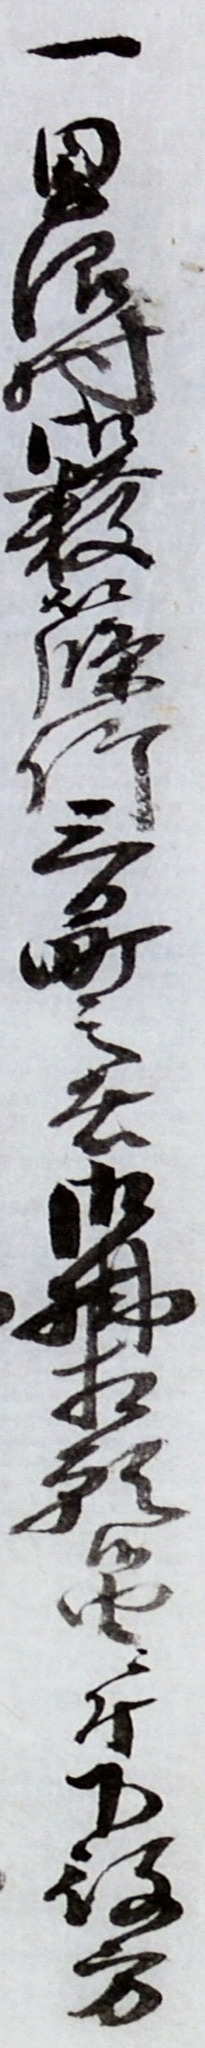一日沼村御藪御篠竹三日町之者御払相願候由ニ付下役方
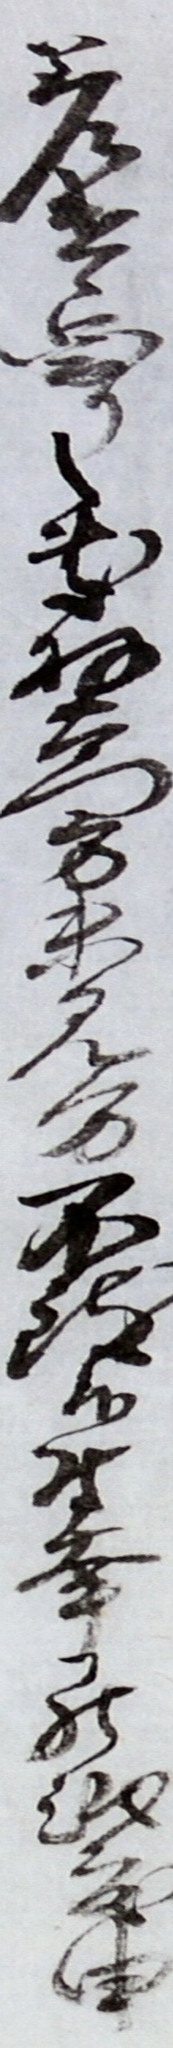差遣候図り之処羽右衛門方未見分不致候付奉罷越度由
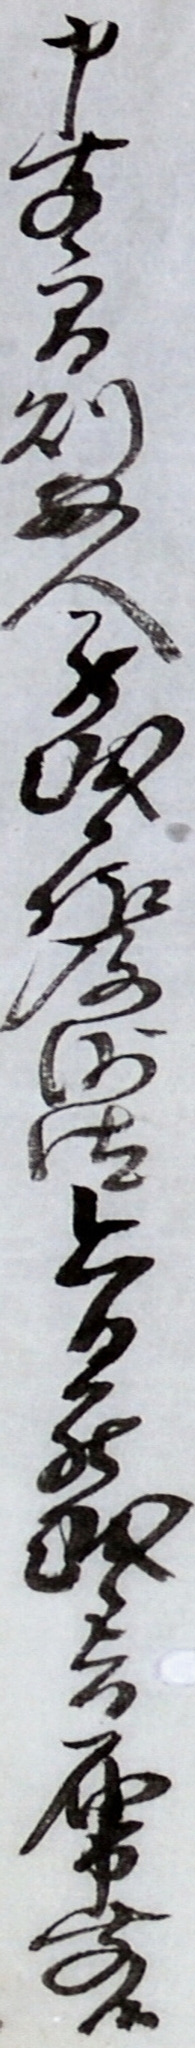申聞候間則両人罷越候様及沙汰今日罷越候旨届申聞候
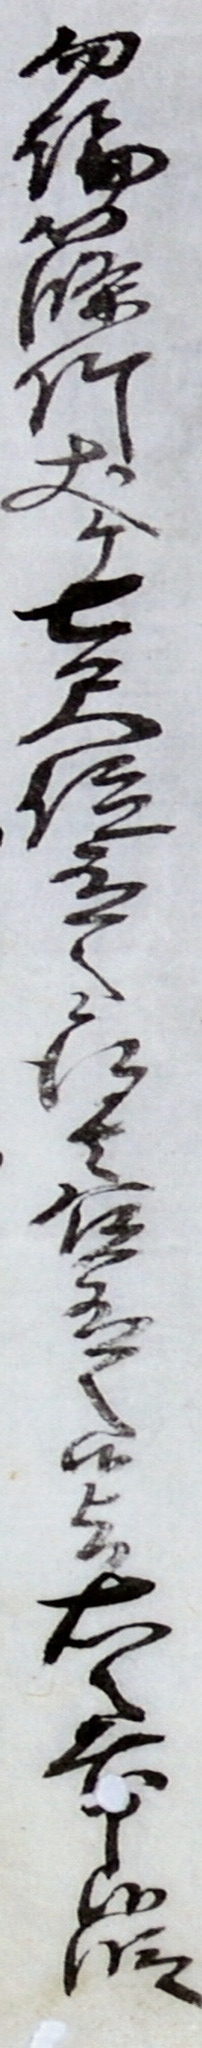勿論篠竹丈ヶ七尺位有之候得者宜有之候旨右之者申候段
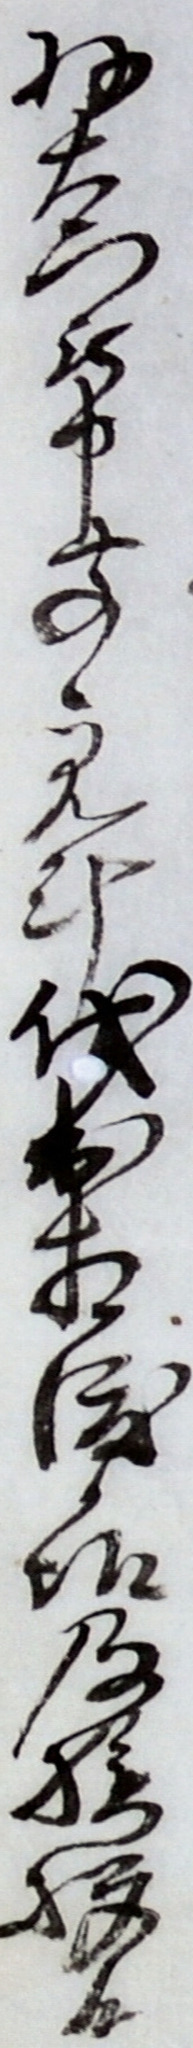一羽右衛門被申聞候見計伐出相渡候様及挨拶候

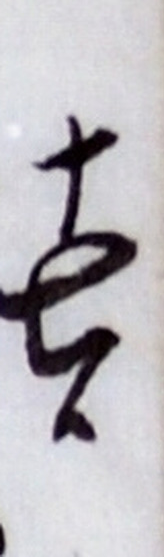十七日
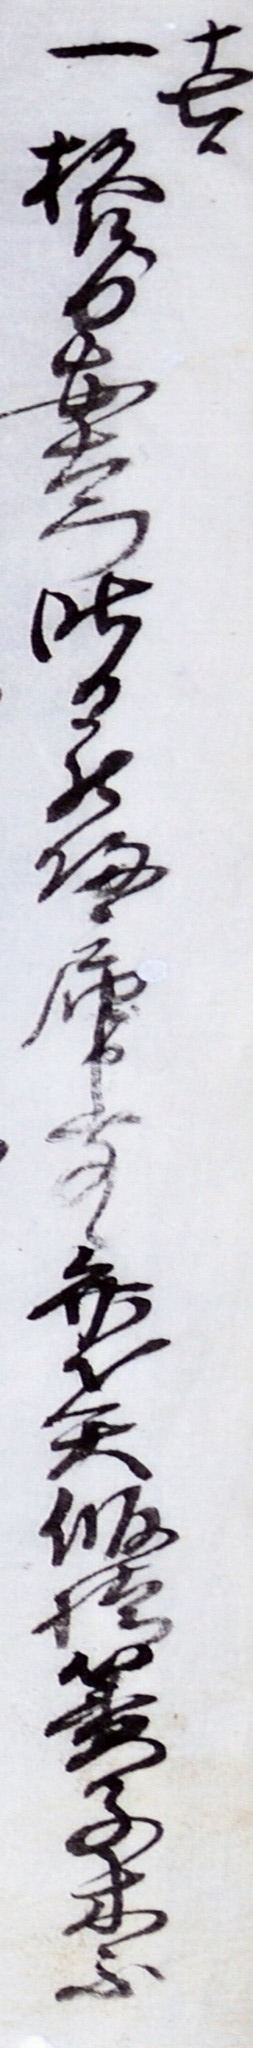一杉左衛門安右衛門昨日罷帰候届申聞候弁才天仮橋簀子木不
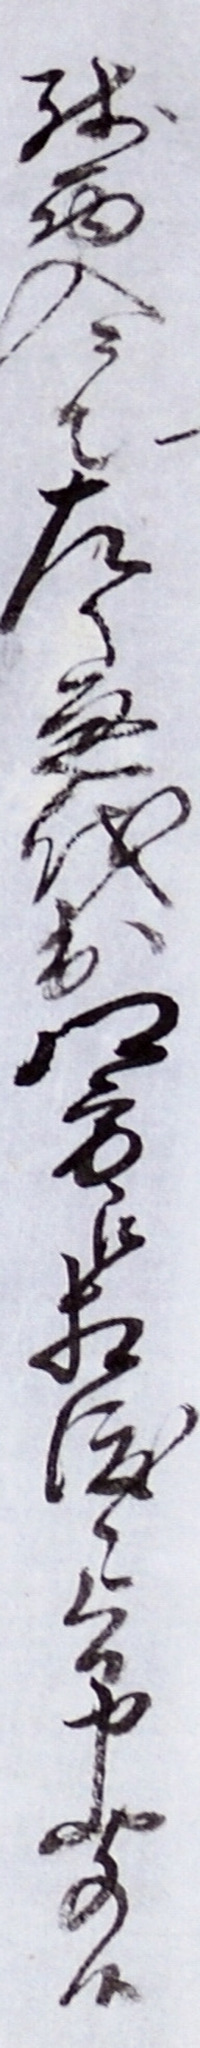残西入ニ而左之通伐出郷方江相渡候旨申聞候
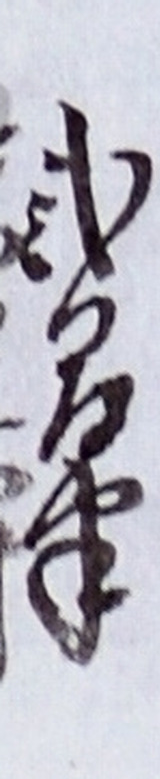弐間半
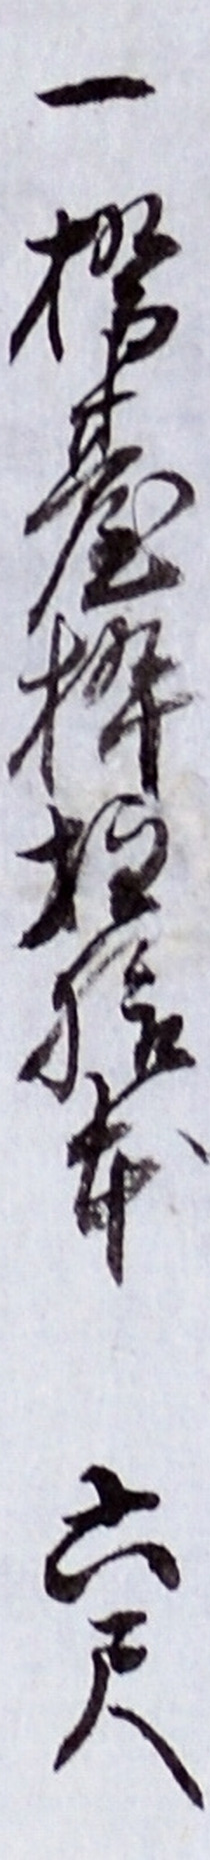一橋台棹拾本六尺
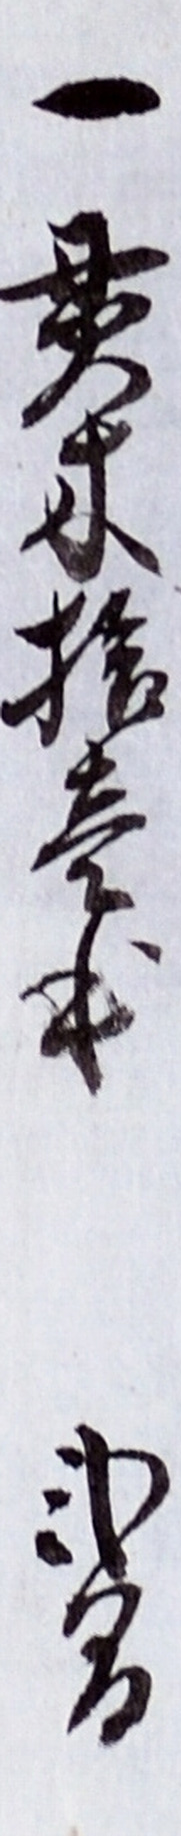一貫木拾壱本弐間
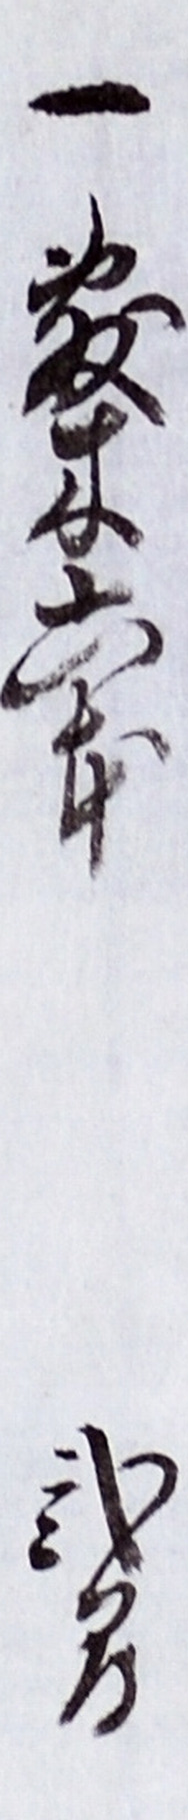一敷木六本弐間
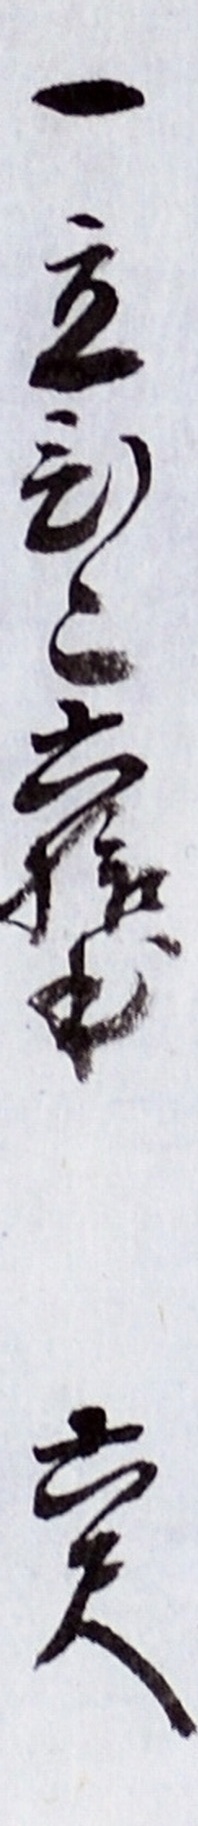一立ひこ六拾本六尺
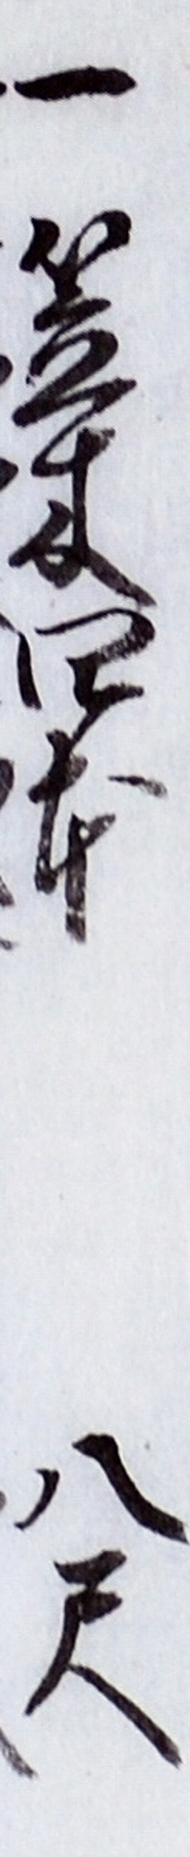一笠木四本八尺
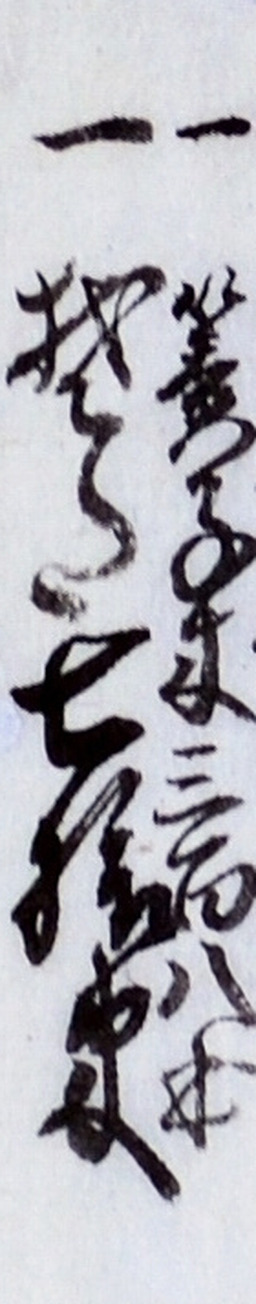一そた七拾束
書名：御山奉行御用控
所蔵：伊那市立高遠町図書館・合同会社AMANE
